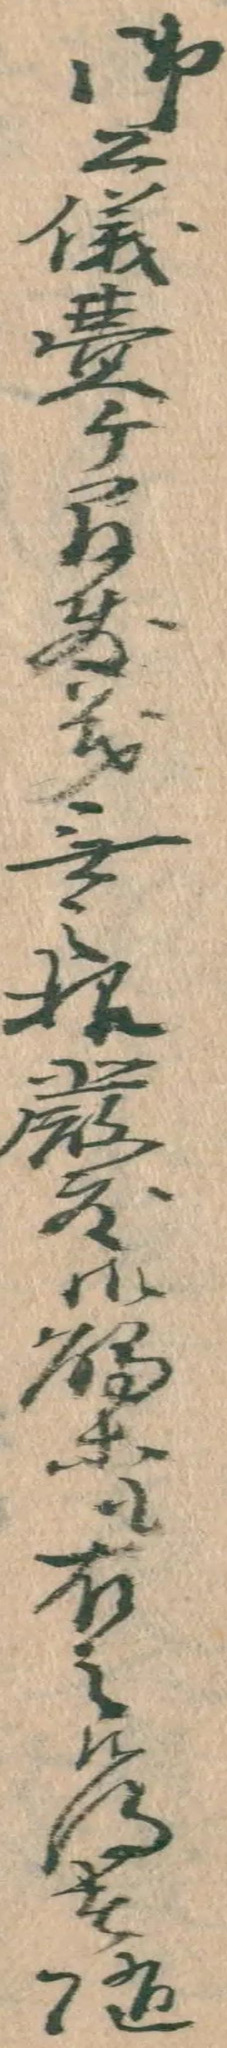御公儀費ヶ間敷義無之様厳度敷御觸等も有之候得は随
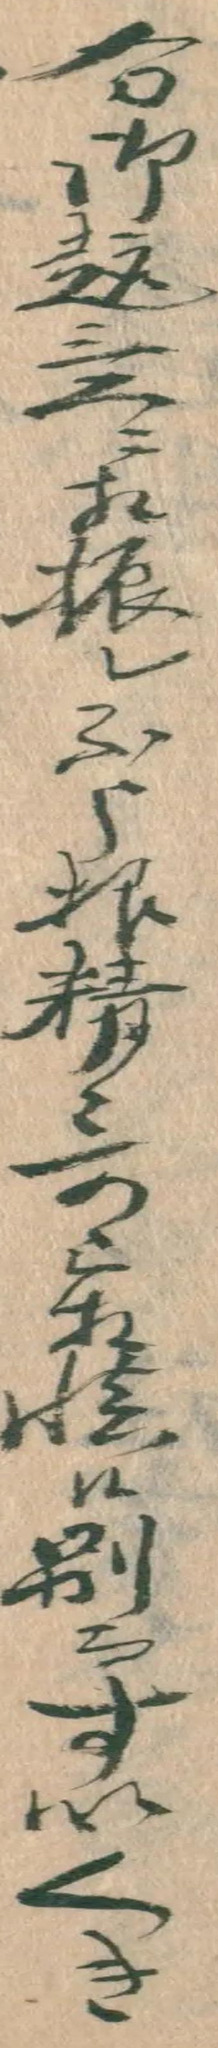分御趣意ニ相振レ不申様精々可被相慎候別而すいくき
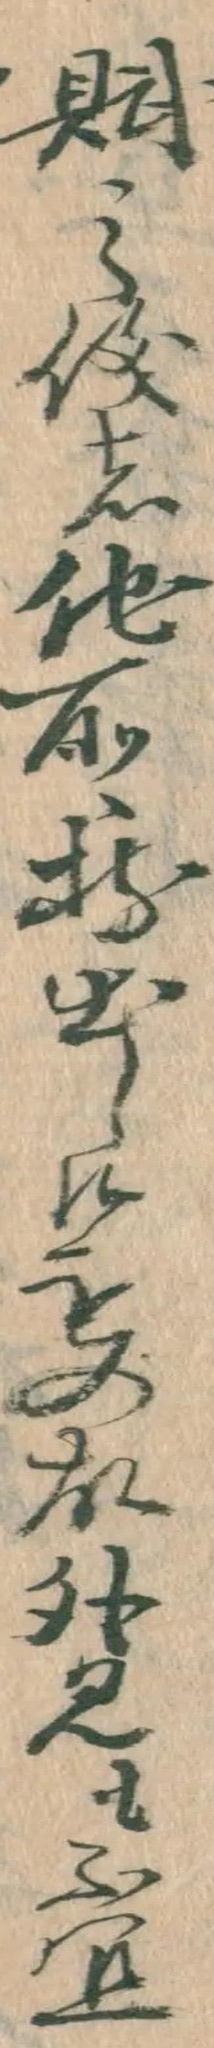賦之儀者他所へ持出し候もの故外見も不宜
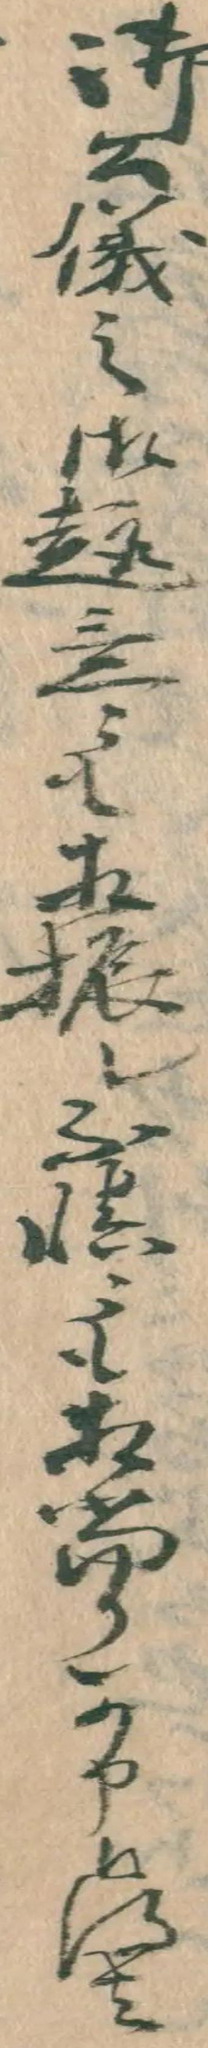御公儀之御趣意にも相振レ不慎ニも相當り可申候得は
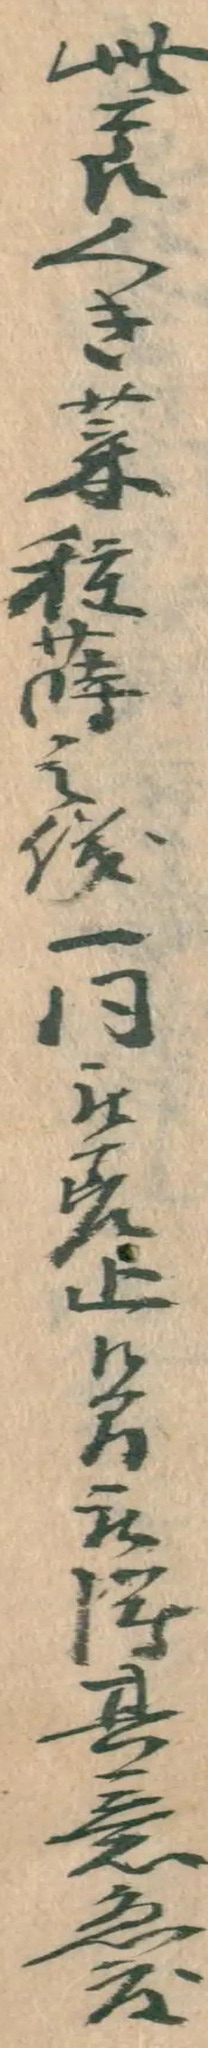此節くき菜種蒔之儀一同被差止候間被得其意急度

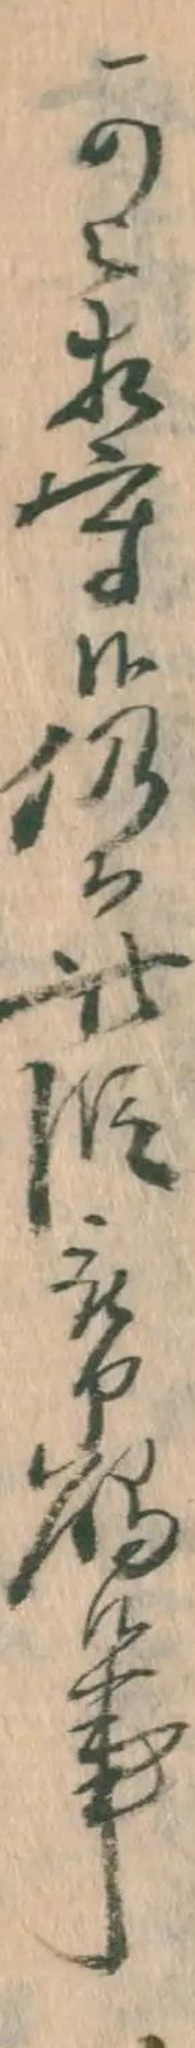可被相守候仍而此段被申觸候事
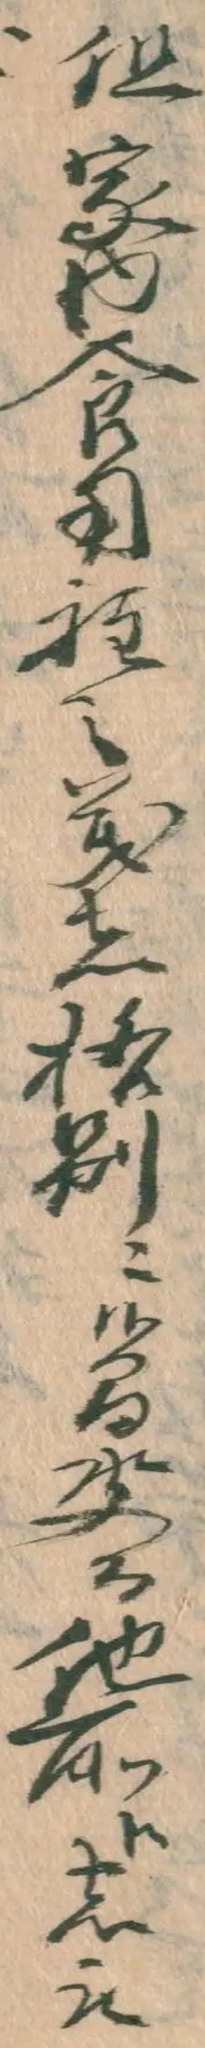但家内食用程之義者格別に候間決而他所え者取
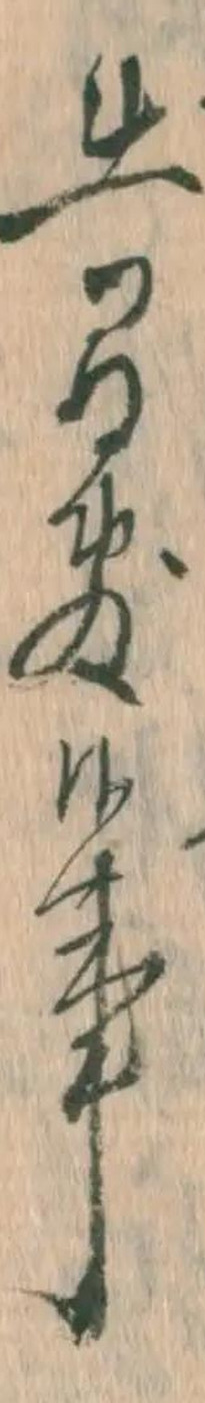出間敷候事
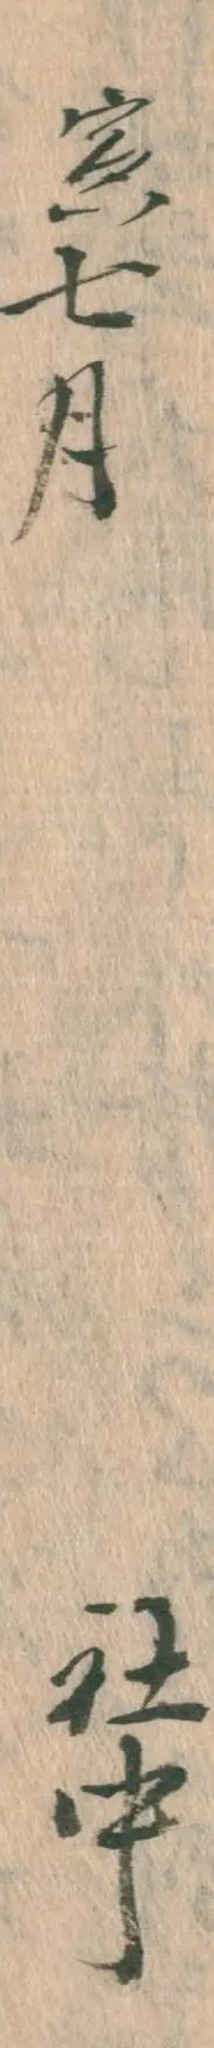寅七月社中
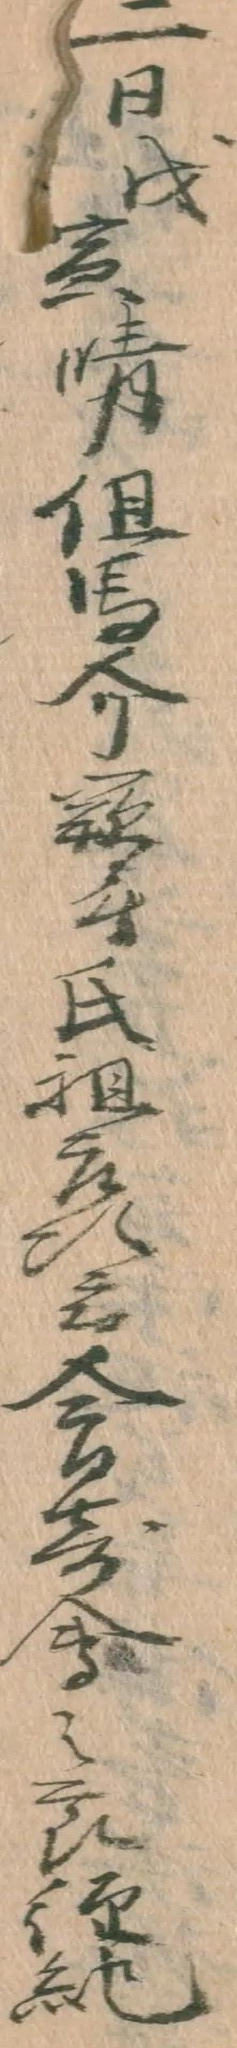二日戊寅晴但馬介闕ニ付氏祖取次ニ而今日寄會之節経紀
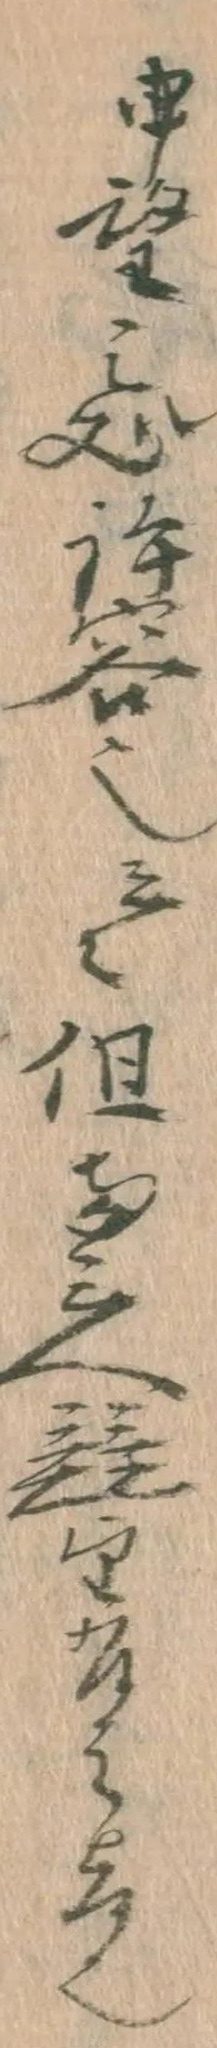申望之処許容也云〻但両三人競望有之旨也
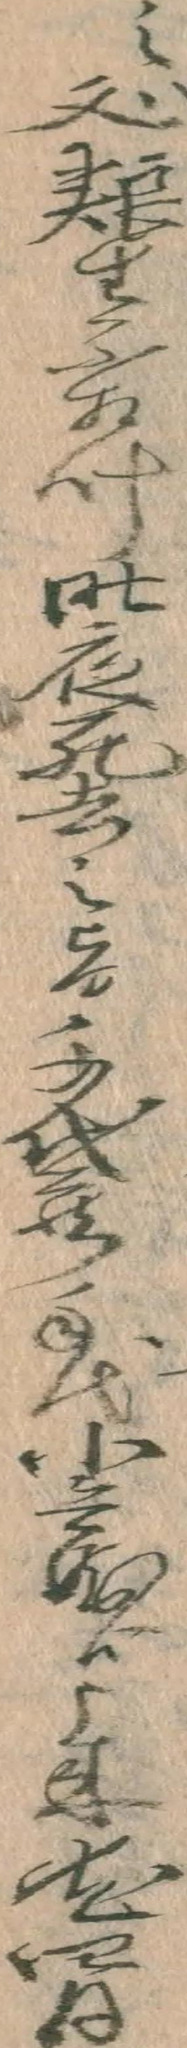之処養生不相叶昨夜死去之旨手代蔵手代小兵衛ゟ申来尤四月
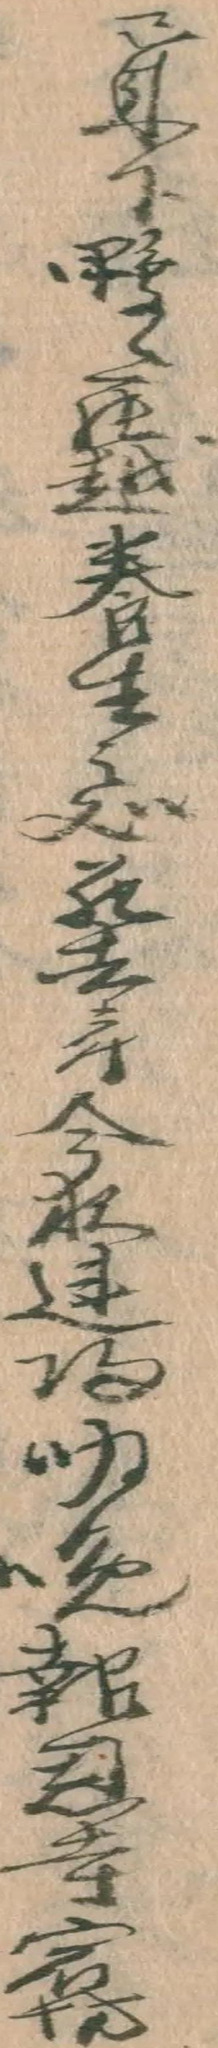已来下鴨へ罷越養生之処死去ニ付今夜連帰明晩報恩寺宿坊
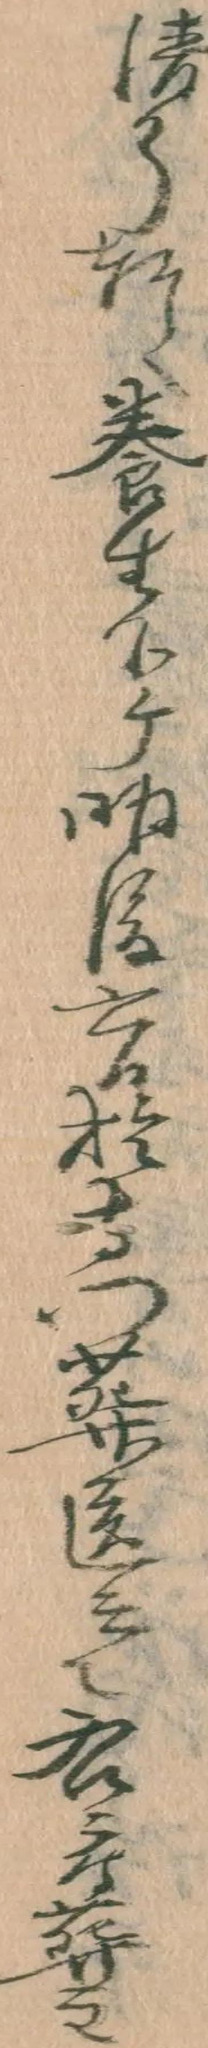清了許へ養生下ケ明後六日於寺門葬送云々右ニ付葬主
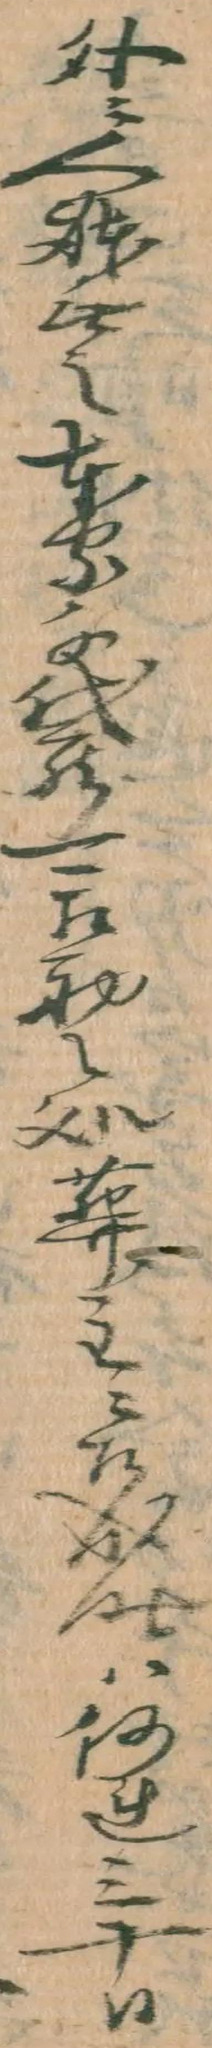外ニ人躰無之本家千代蔵可相勤之処葬主に相成時ハ何れ三十日
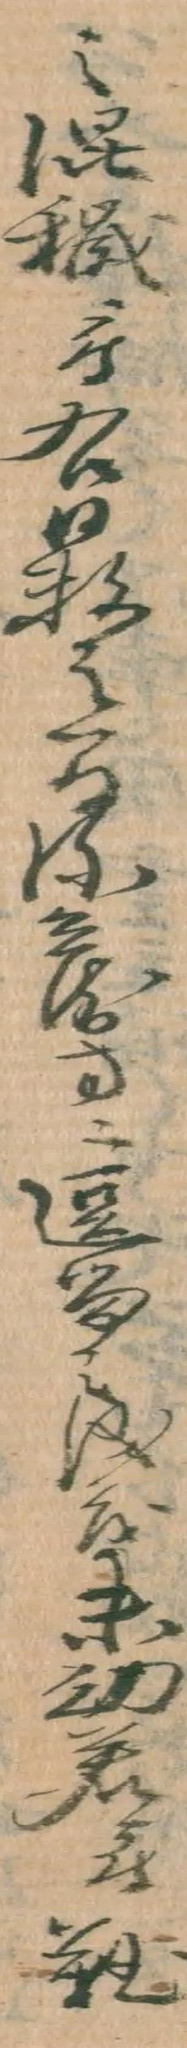之混穢ニ付右日数之間弥兵衛方ニ逗留之儀も未幼若ニ付難
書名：賀茂社記録. 第69冊
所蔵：国立国会図書館 National Diet Library, JAPAN
